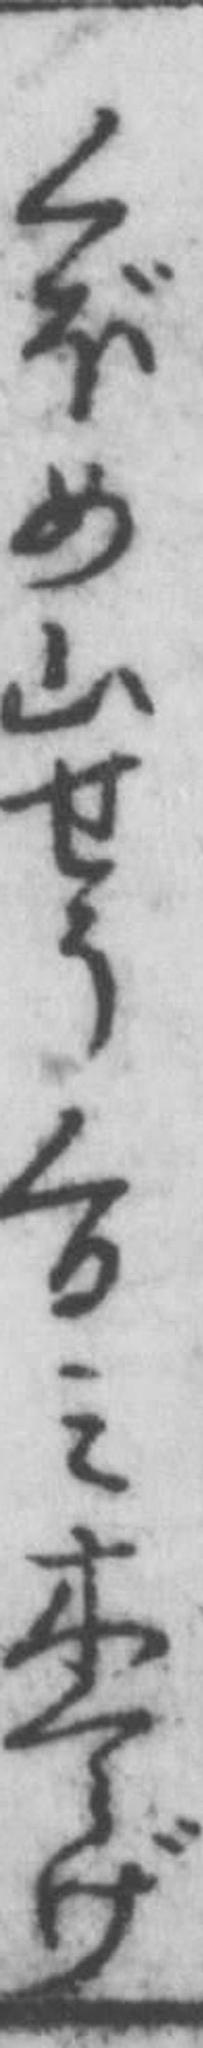くぼめ山せうくるミ木くらげ
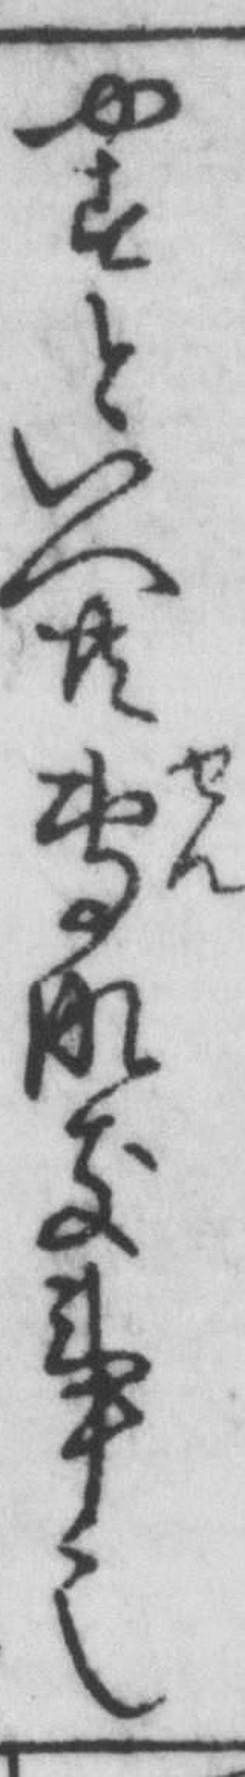やすといへ共詮方なき事
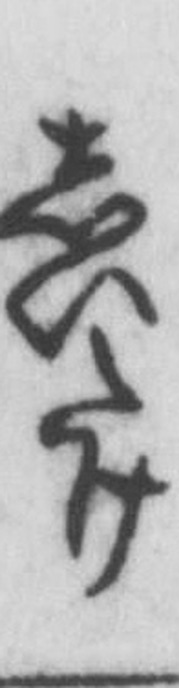しいたけ
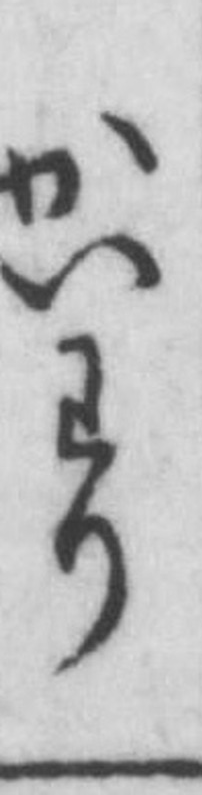かいわり
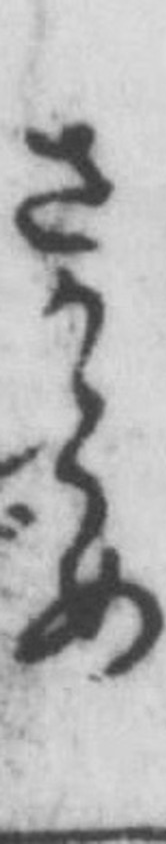さからめ
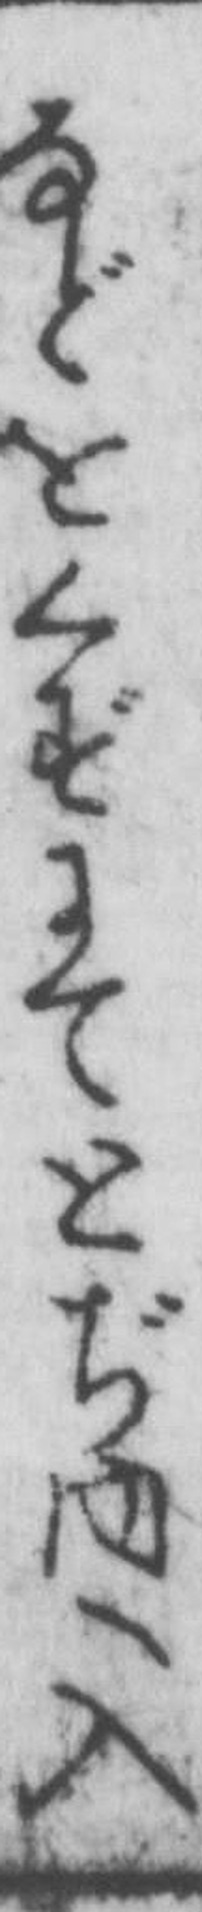などをくずにてとぢ内へ入
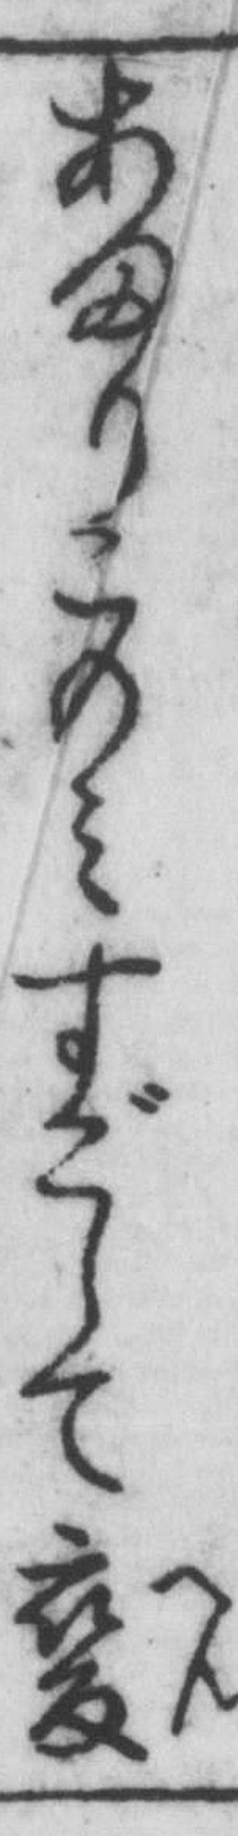あまりこのミすごして変
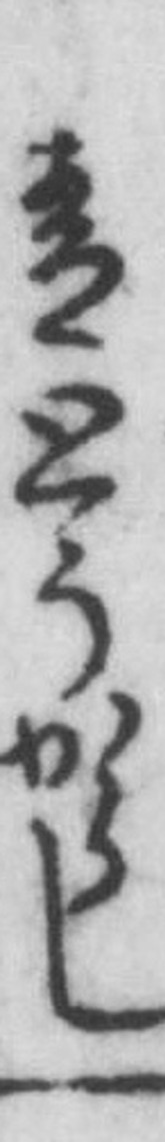青とうからし
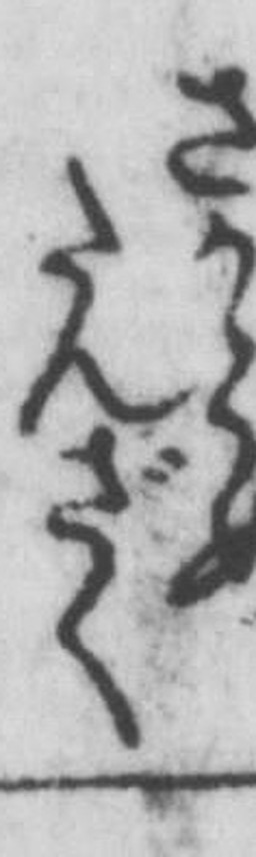たんざく
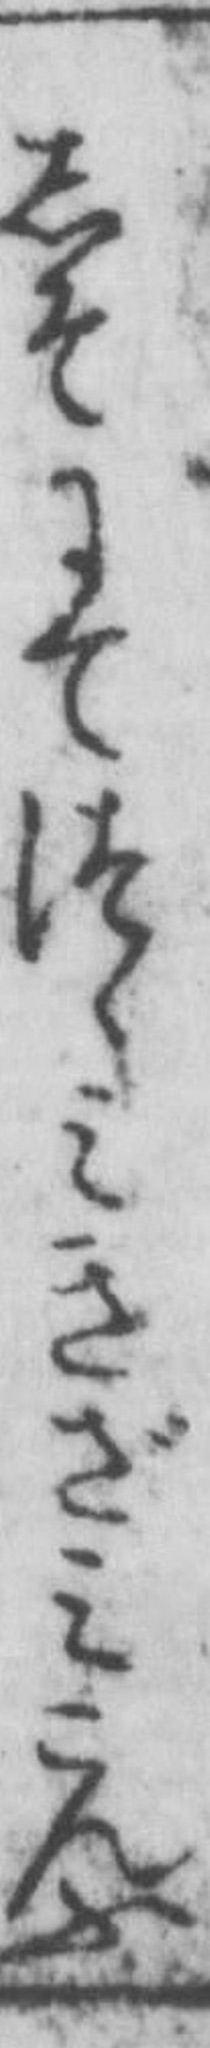しそにつゝミきざミこんふ
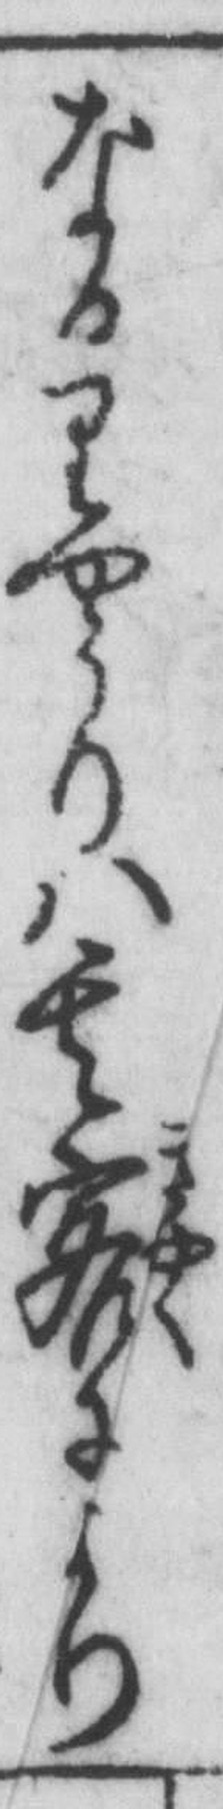なるしやうりハ其客により
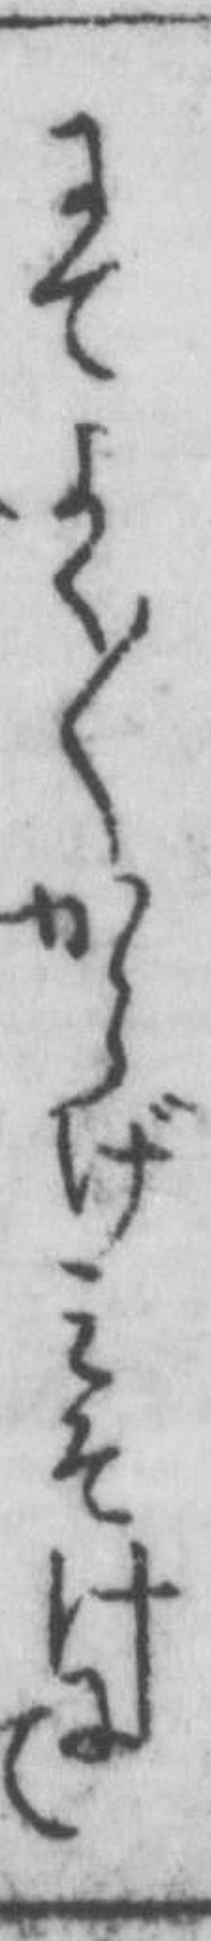にてよく〳〵からげミそ汁にて
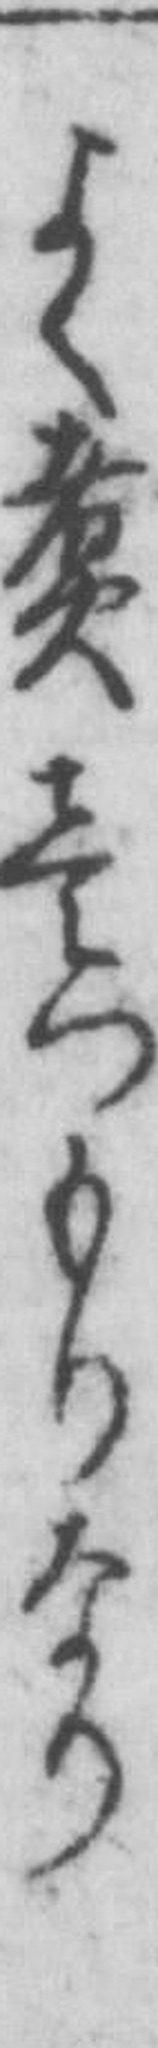よく煮つもりなり
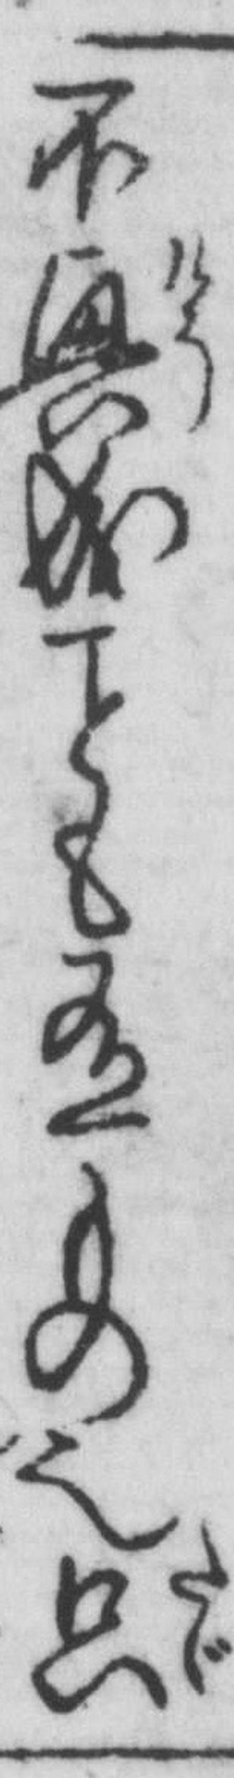不興成ことも有もの也只
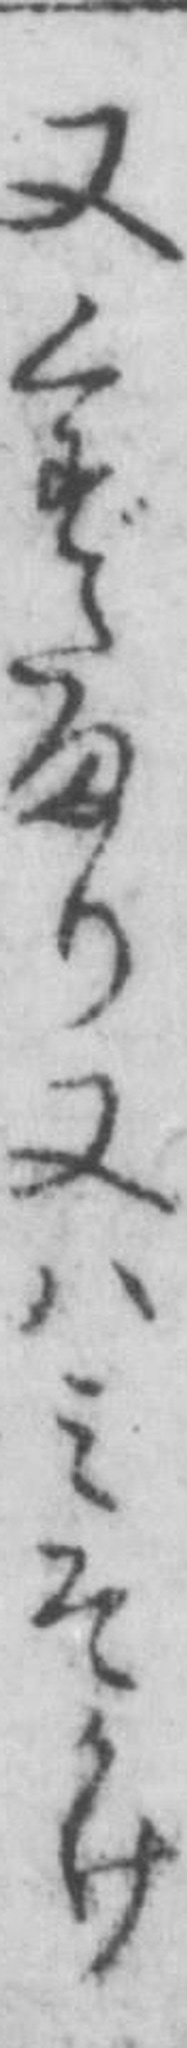又くずたまり又ハミそかけ
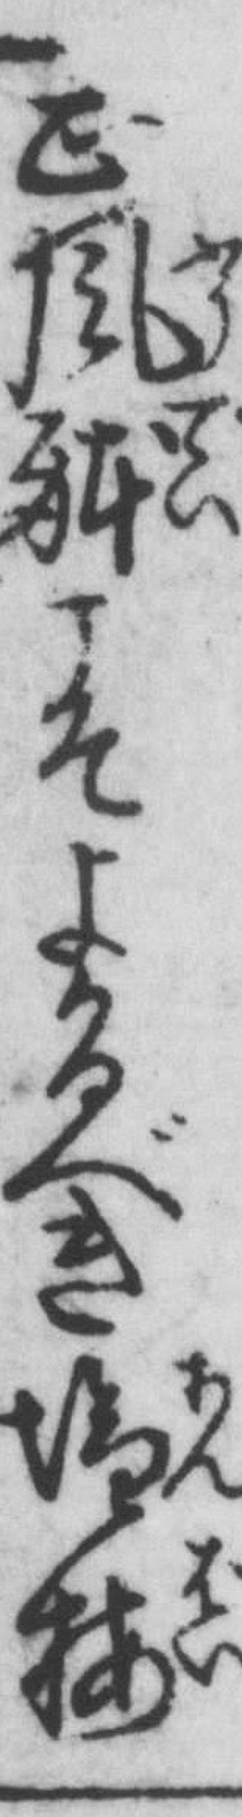風躰そよかるべき塩梅
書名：料理献立抄
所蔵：大阪府立大学学術情報センター 国文学研究資料館
